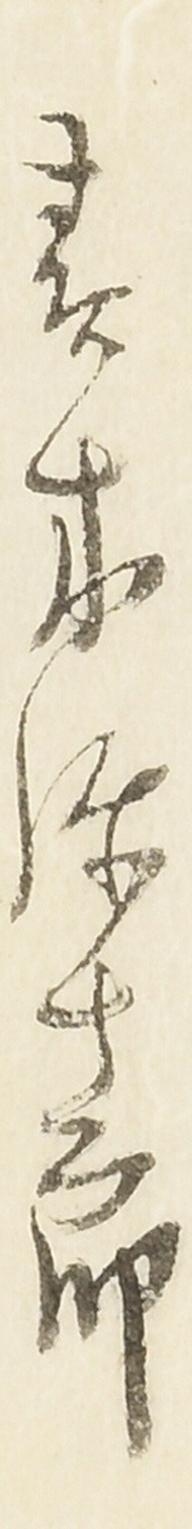春木弥十郎
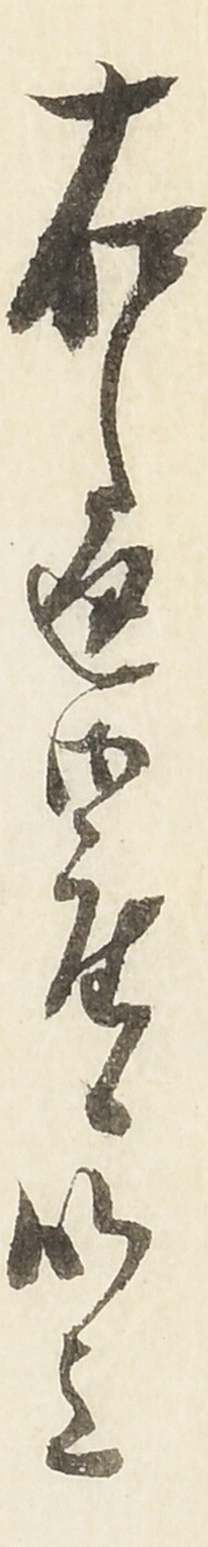右之通御座候以上
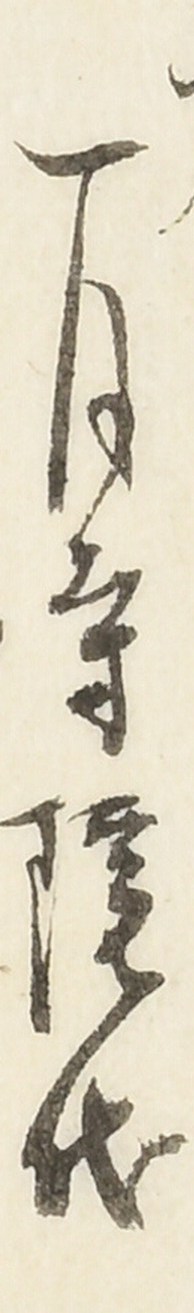一月寺院代
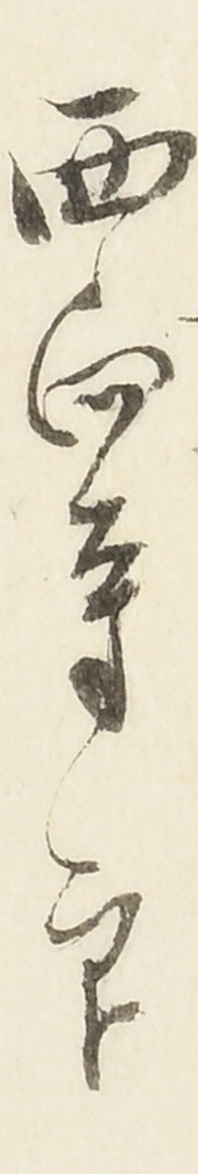西向寺印
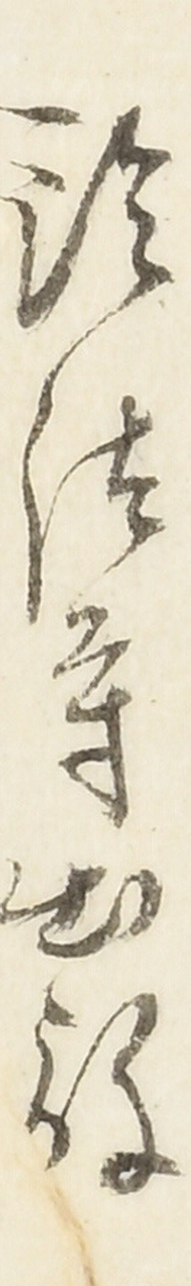鈴法寺出役
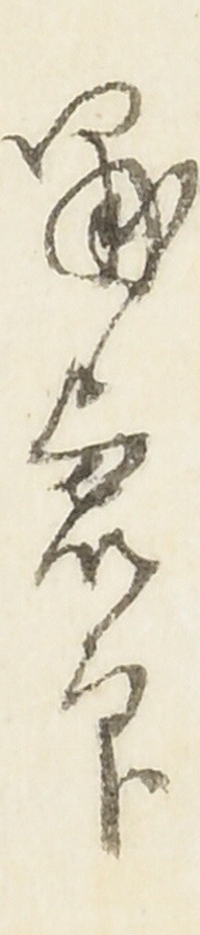浦衆印
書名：秘書
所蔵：伊那市立高遠町図書館・合同会社AMANE
